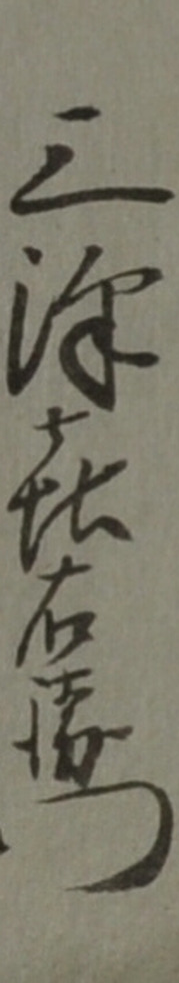三沢喜右衛門
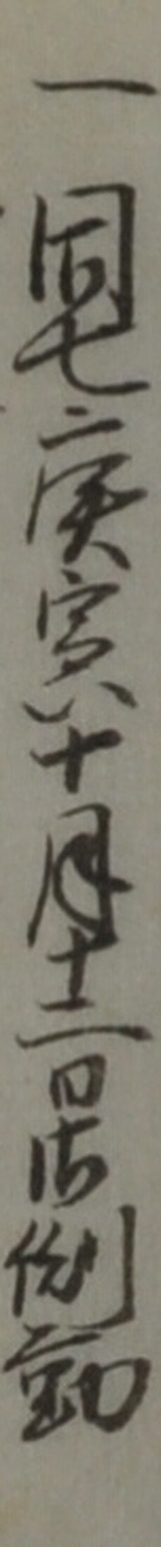一同七庚寅十月十二日御側勤
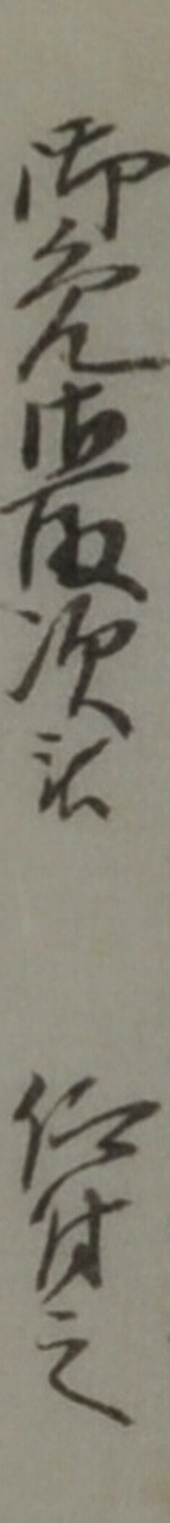御免御取次被仰付之
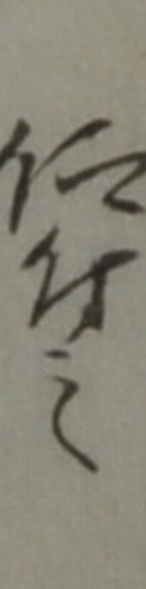仰付之
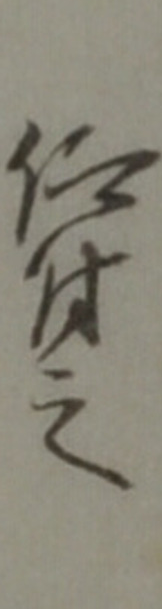仰付之
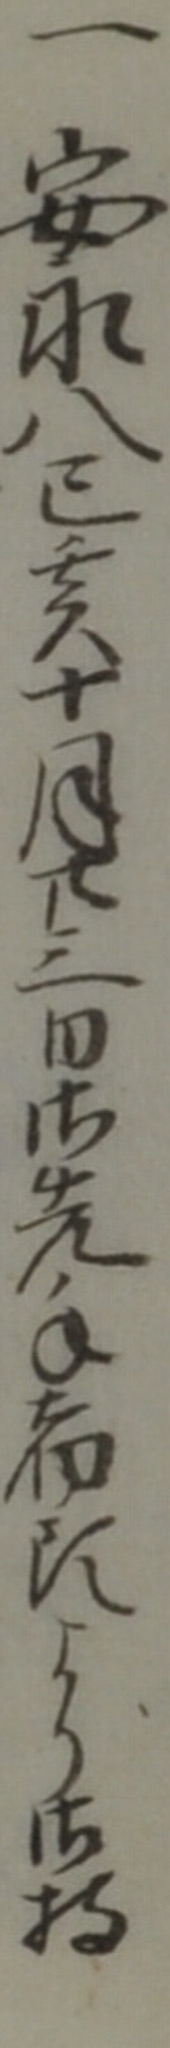一安永八己亥十月廿三日御先手者頭より御持
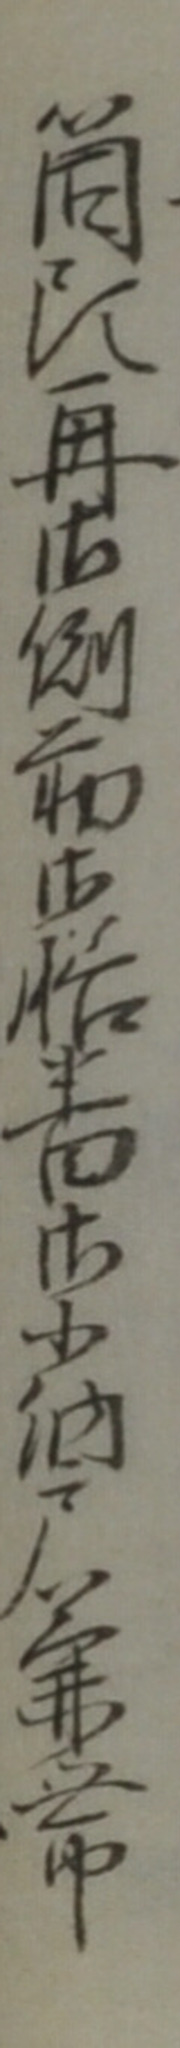筒頭再御側勤御膳番御小納戸兼帯
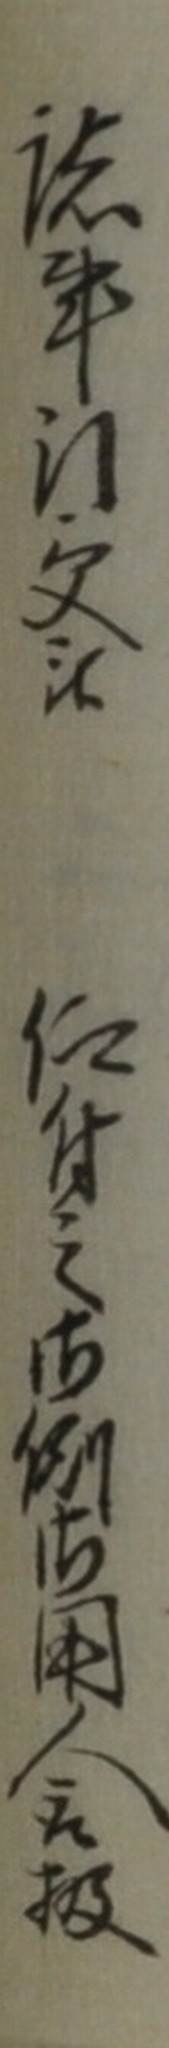諸事引受被仰付之御側御用人取扱
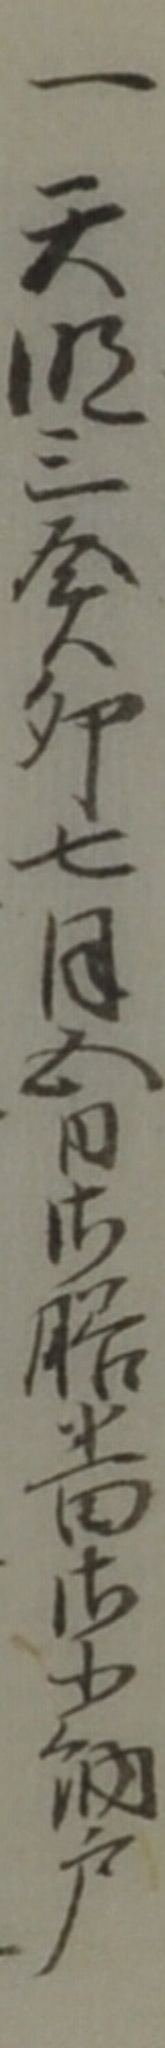一天明三癸卯七月五日御膳番御小納戸
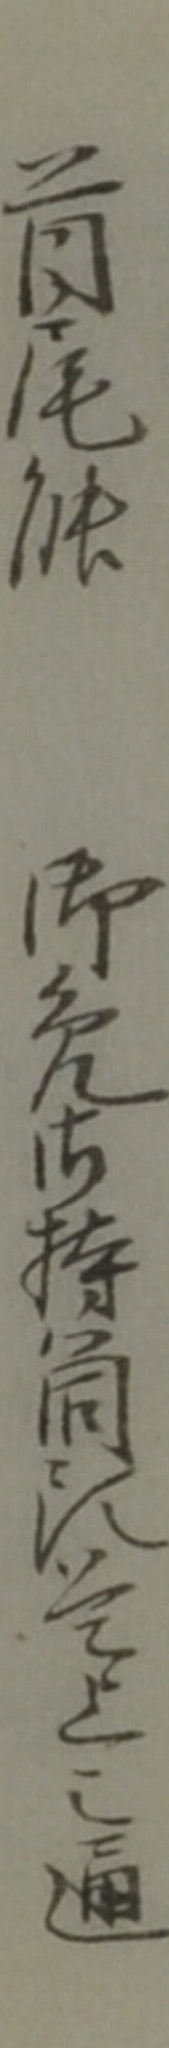首尾能御免御持筒頭是迄之通
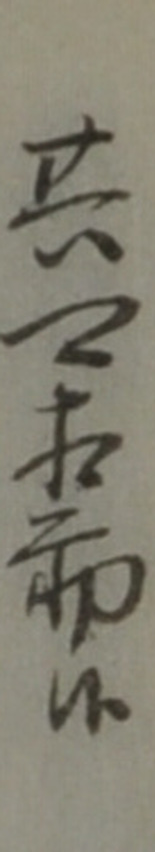共可相勤候
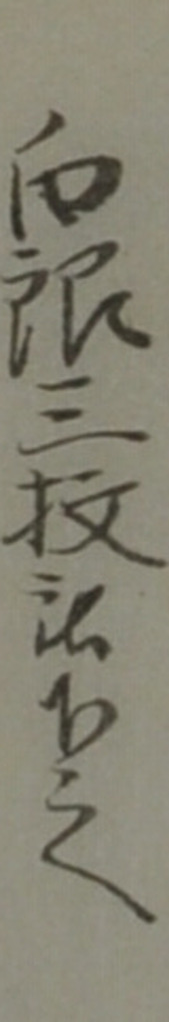白銀三枚被下之
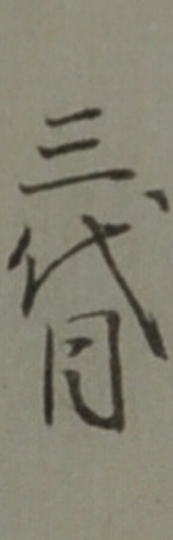三代目
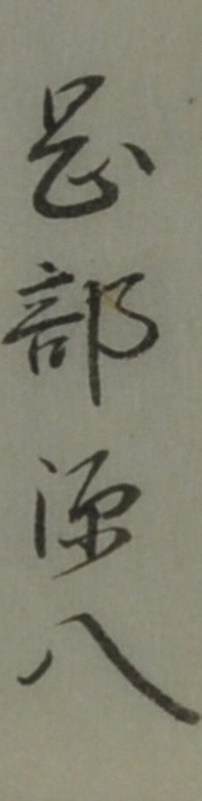岡部源八
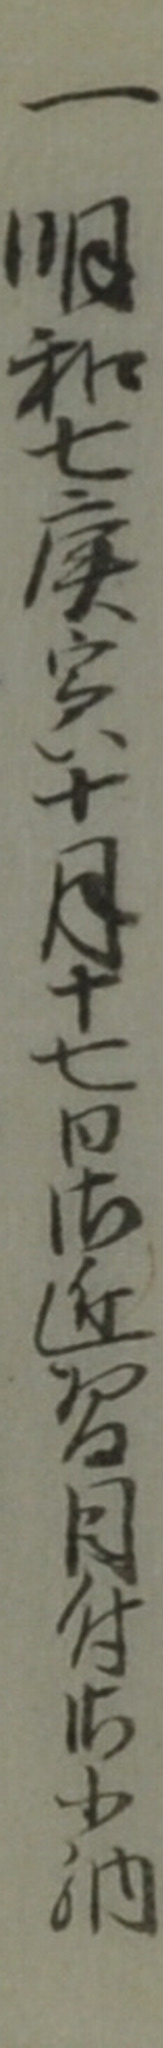一明和七庚寅十月十七日御近習目付御小納
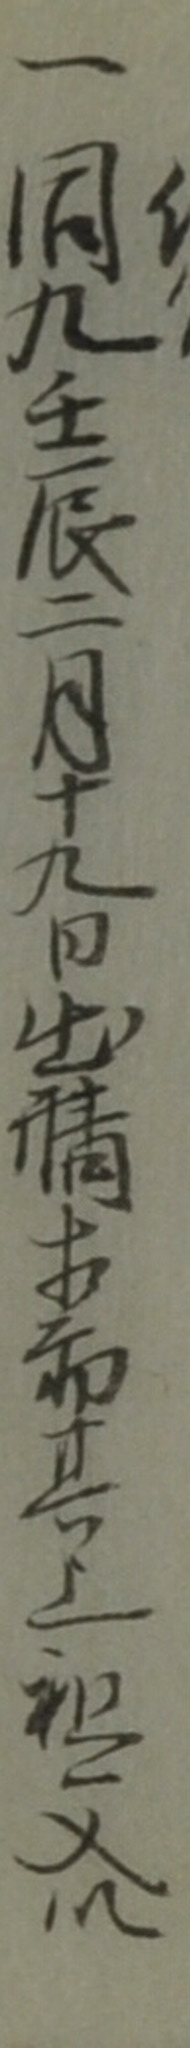一同九壬辰二月十九日出精相勤其上祖父以
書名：諸御役代々録（四）
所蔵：伊那市立高遠町図書館・合同会社AMANE
